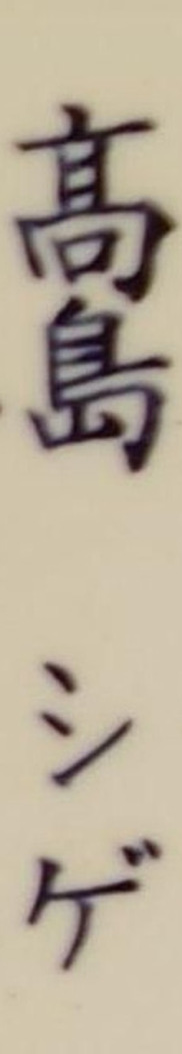高島シゲ
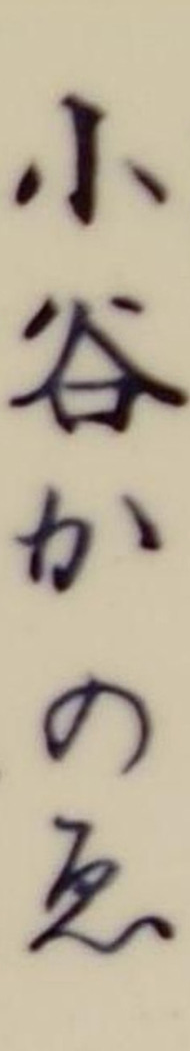小谷かのゑ
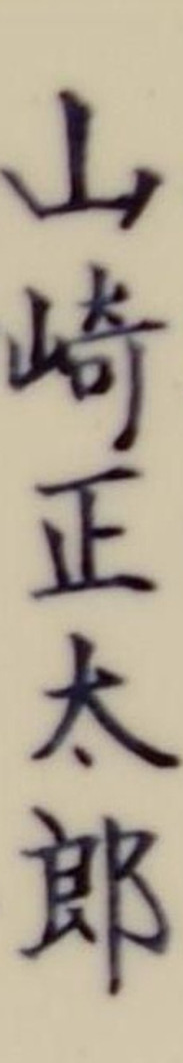山崎正太郎
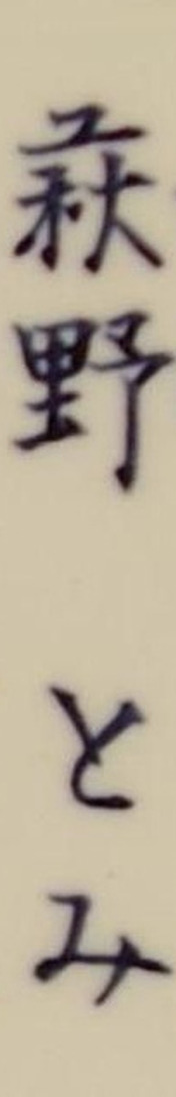萩野とみ
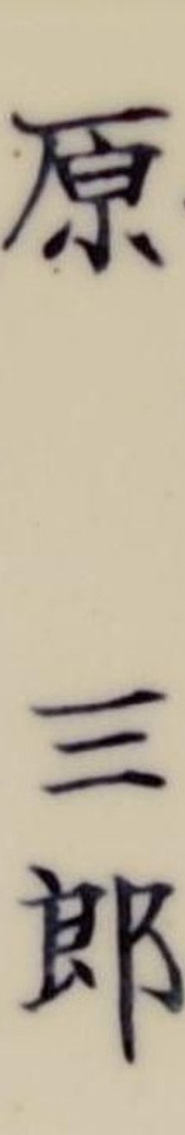原三郎
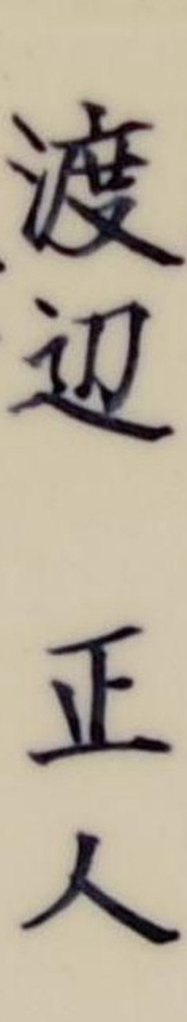渡辺正人
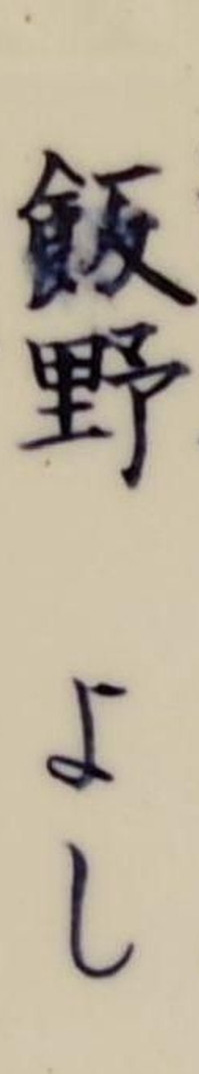飯野よし
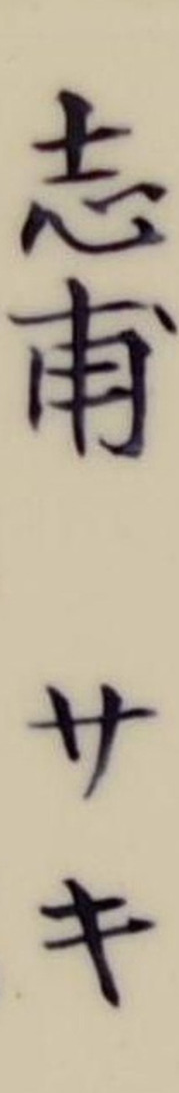志甫サキ
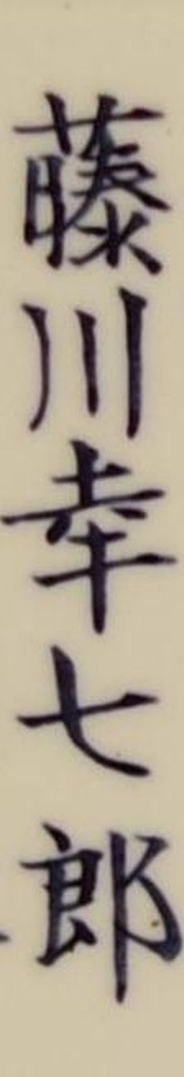藤川幸七郎
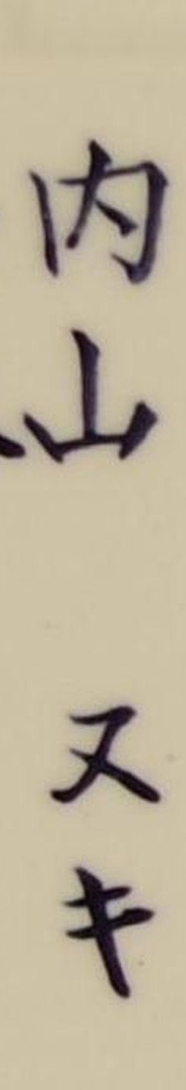内山ヌキ

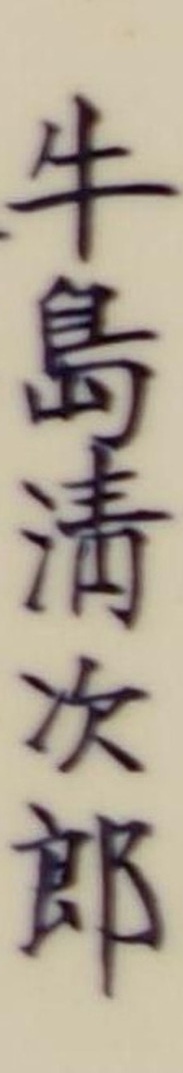牛島清次郎
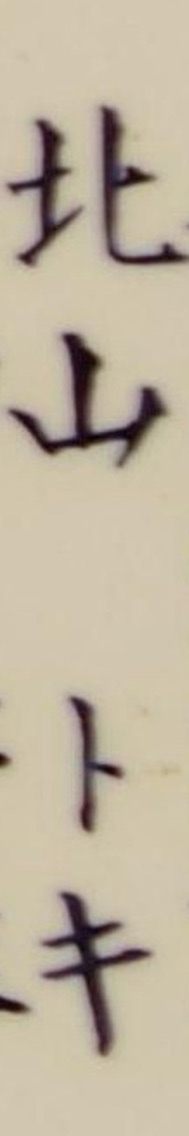北山トキ
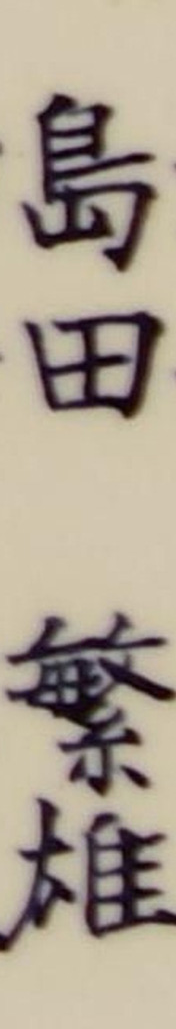島田繁雄
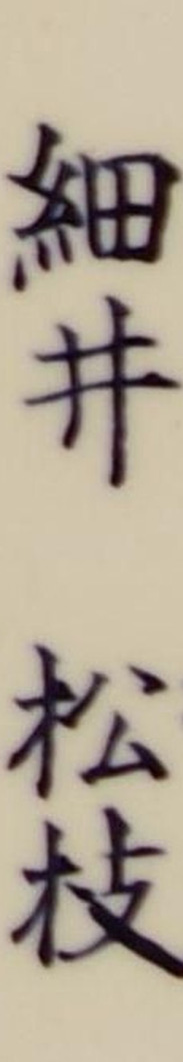細井松枝
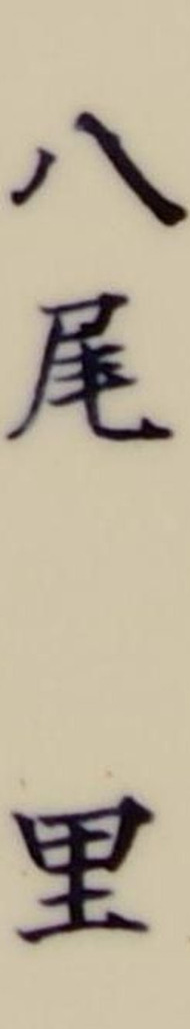八尾里
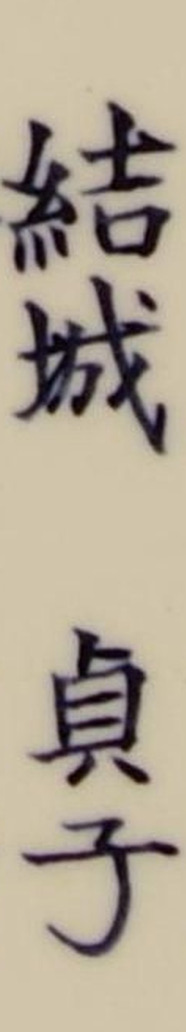結城貞子
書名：E~L
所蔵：高野山金剛峯寺
